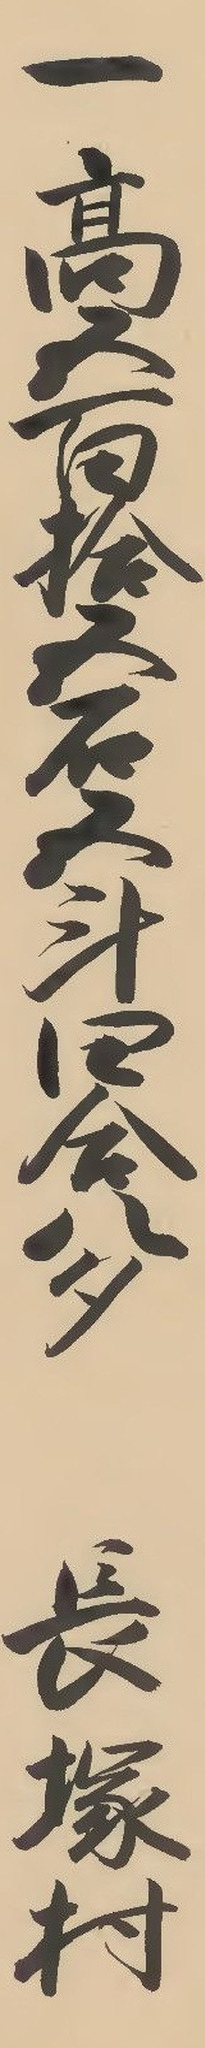一高五百拾五石五斗四合八勺長塚村
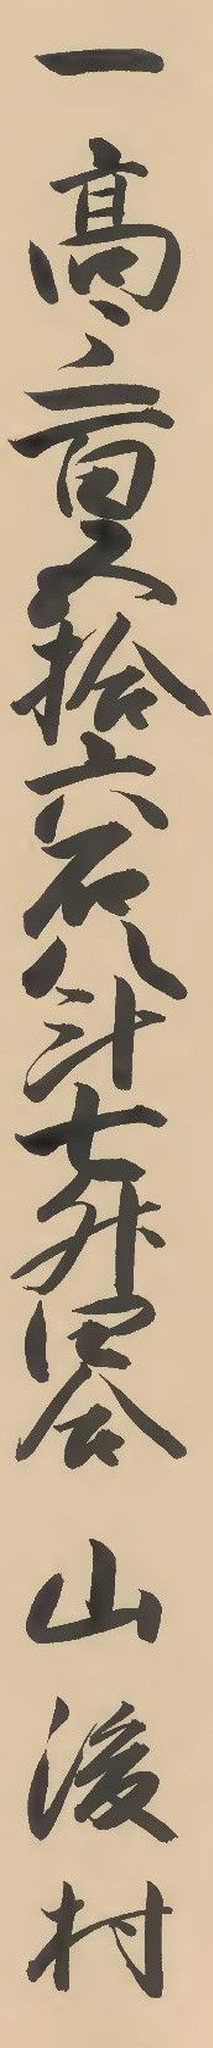一高三百五拾六石八斗七升四合山後村
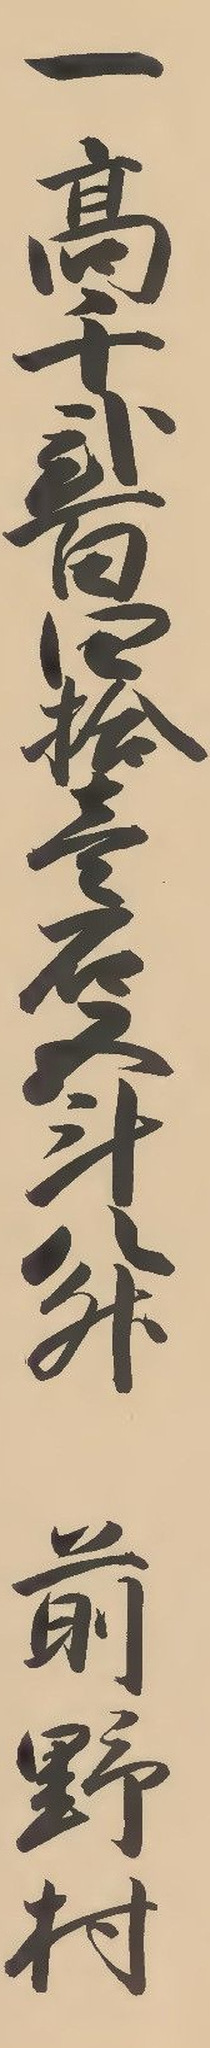一高千弐百四拾壱石五斗八升前野村
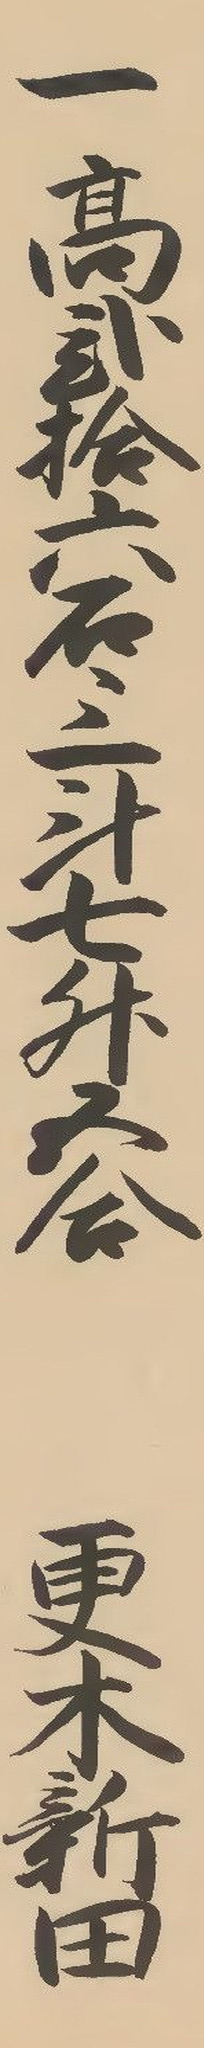一高弐拾六石三斗七升五合更木新田
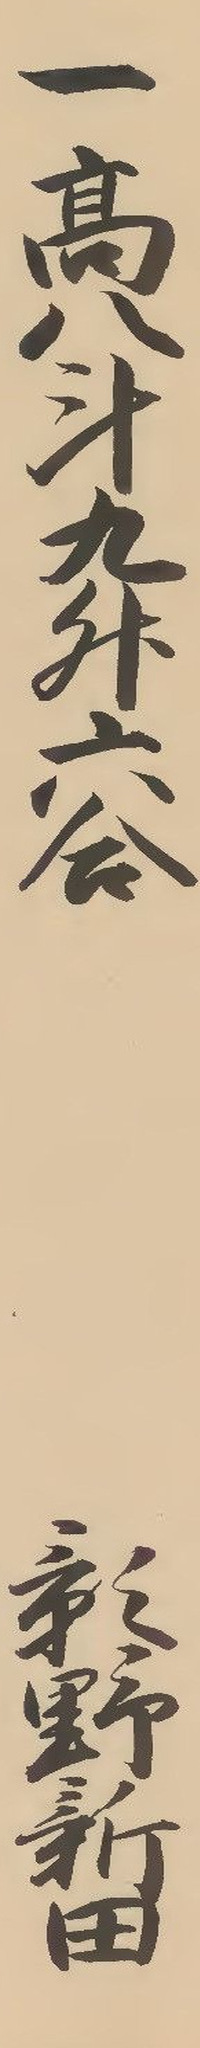一高八斗九升六合影野新田
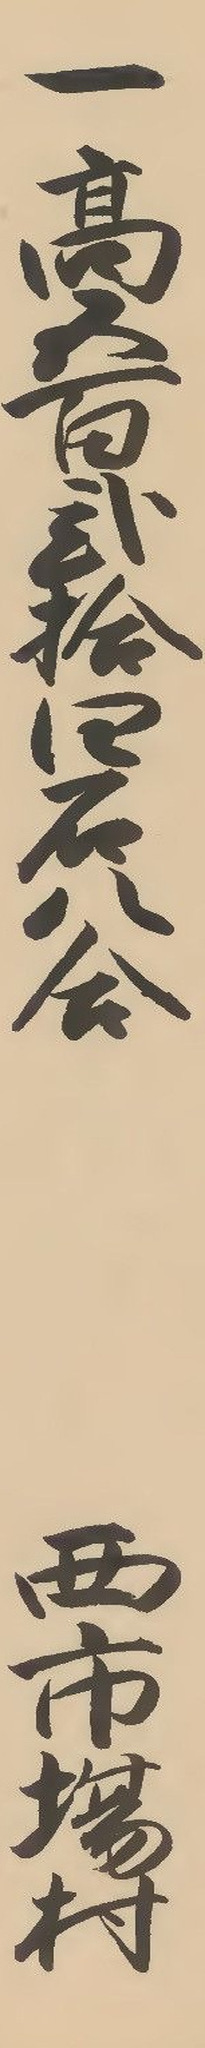一高五百弐拾四石八合西市場村

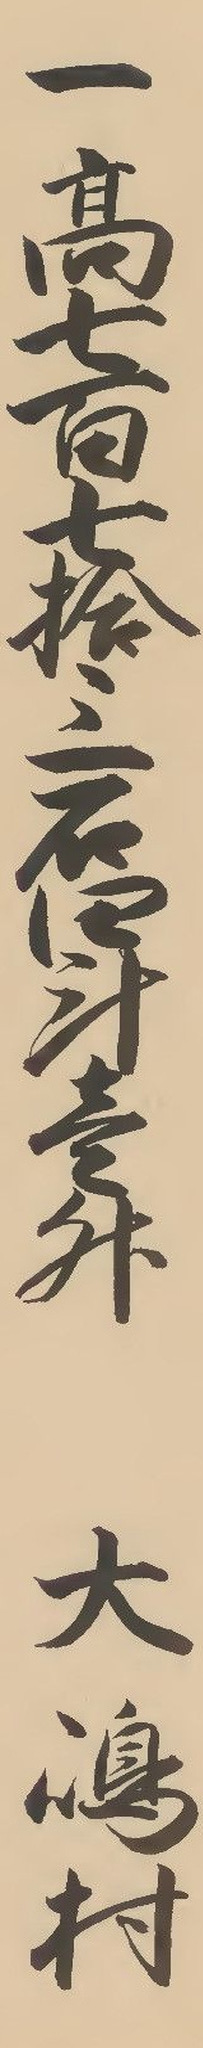一高七百七拾三石四斗壱升大島村
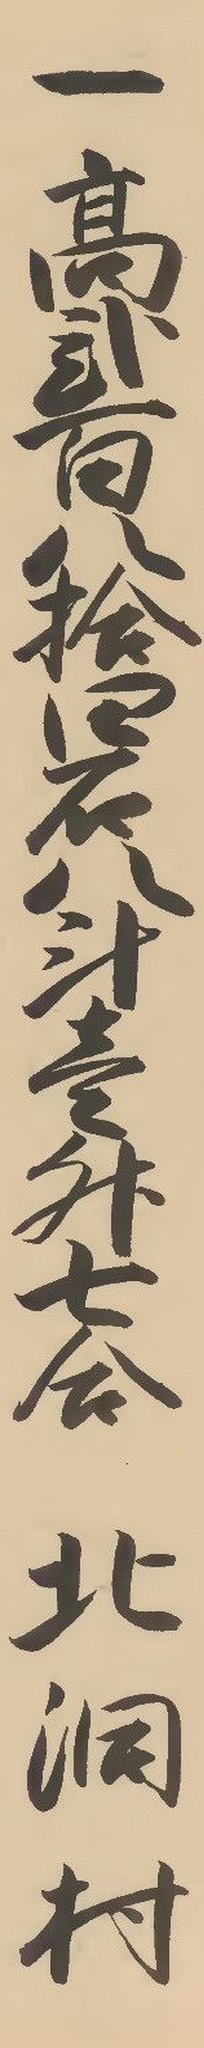一高弐百八拾四石八斗壱升七合北洞村
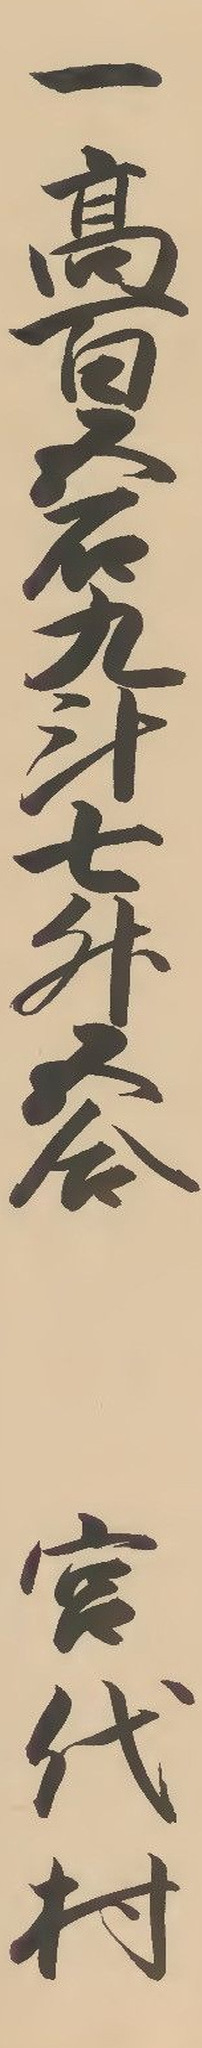一高百五石九斗七升五合宮代村
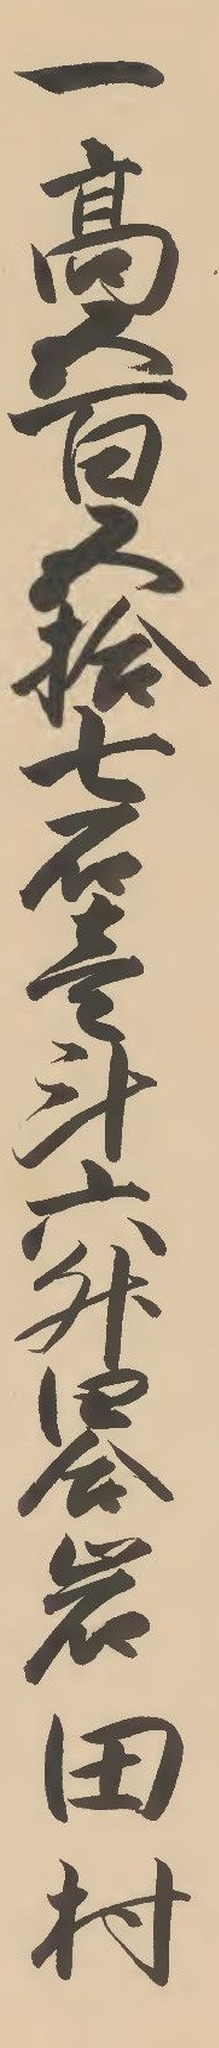一高五百五拾七石壱斗六升四合岩田村
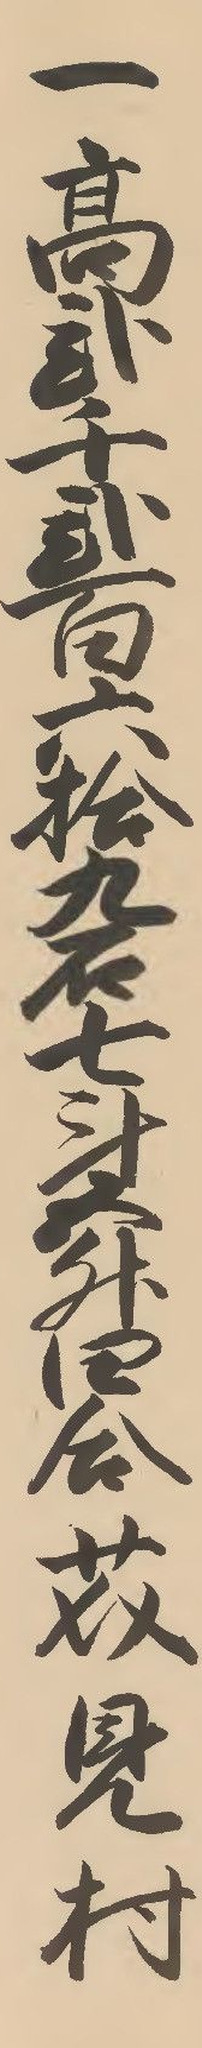一高弐千弐百六拾九石七斗五升四合芥見村
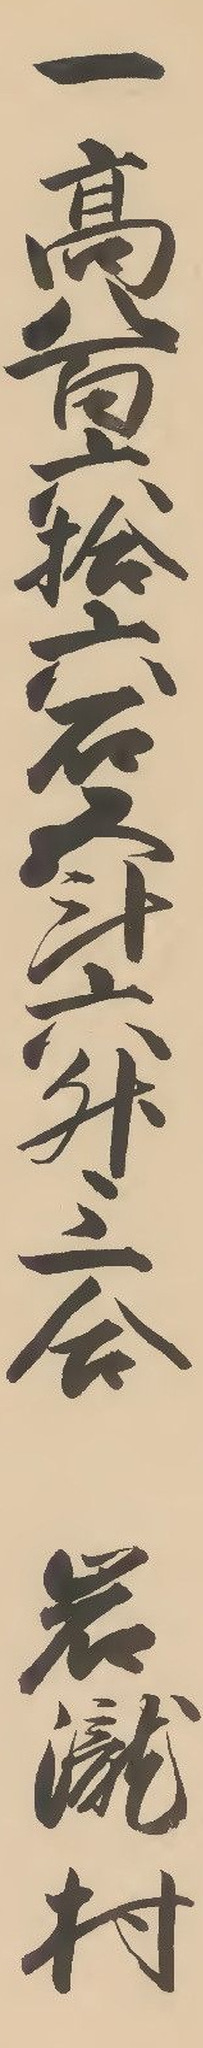一高八百六拾六石五斗六升三合岩滝村
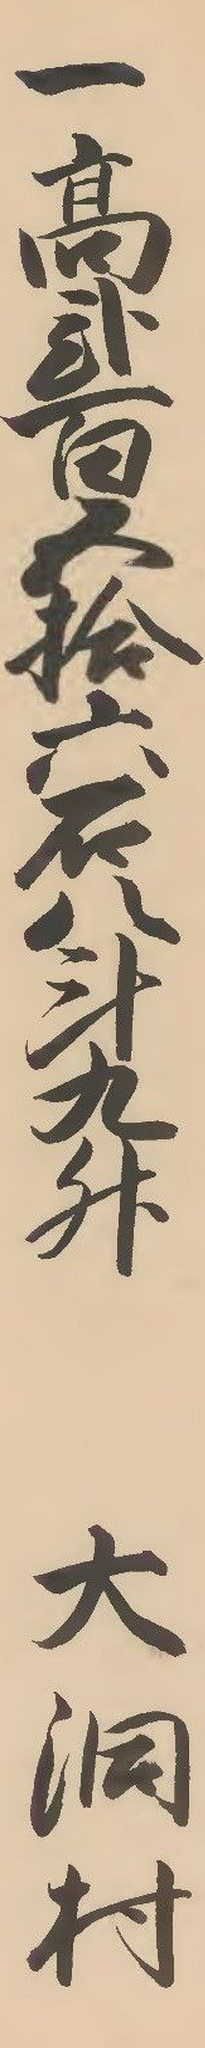一高弐百五拾六石八斗九升大洞村

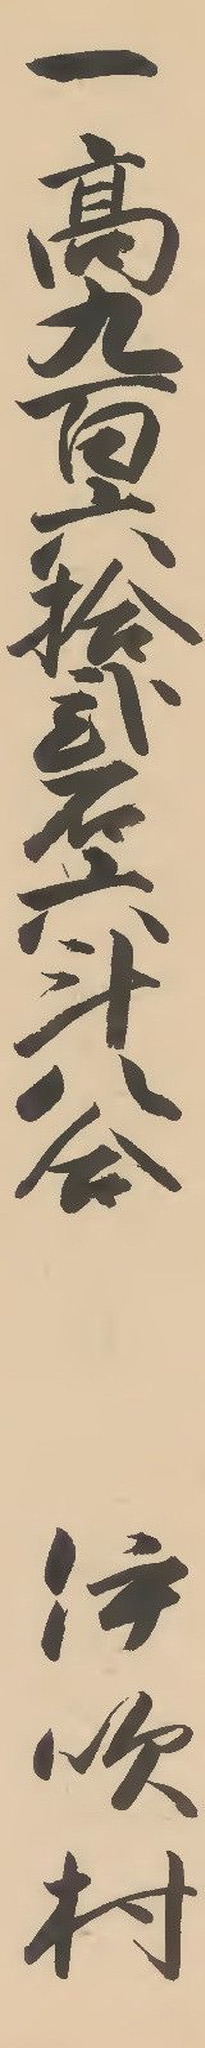一高九百六拾弐石六斗八合伊吹村
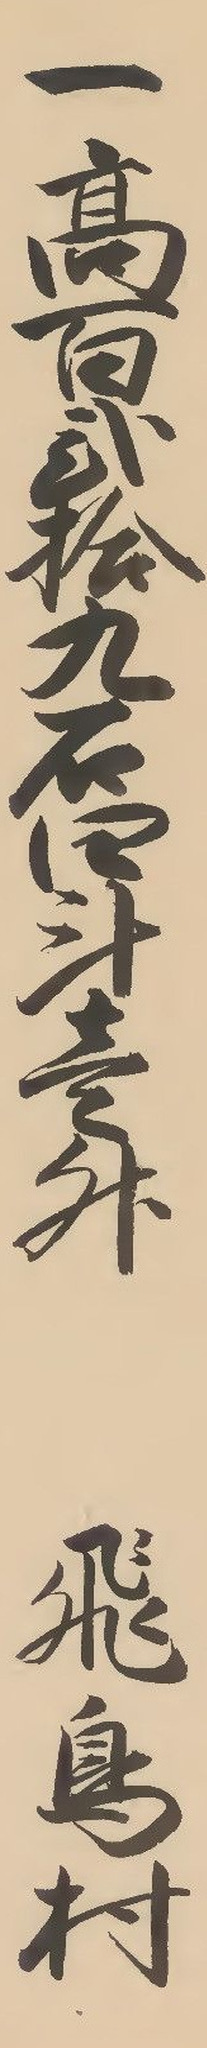一高百弐拾九石四斗壱升飛鳥村
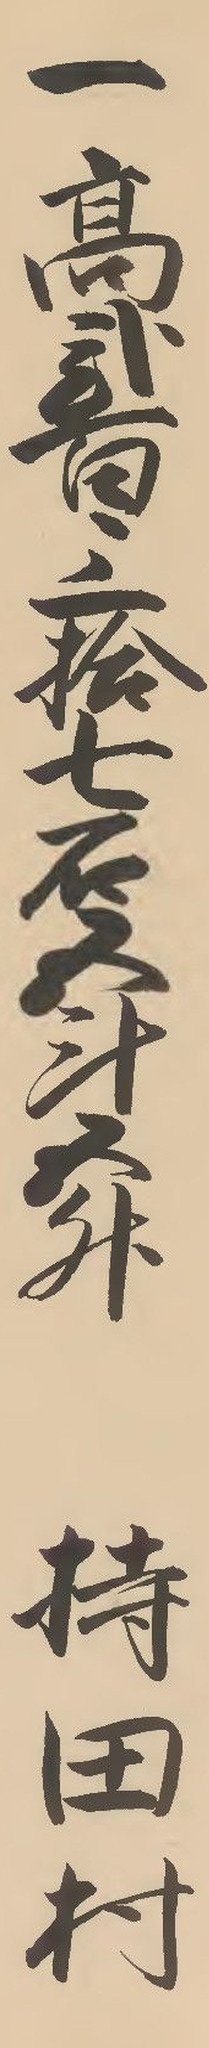一高弐百三拾七石五斗五升持田村
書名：美濃国郷帳
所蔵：国立公文書館 National Archives of Japan
